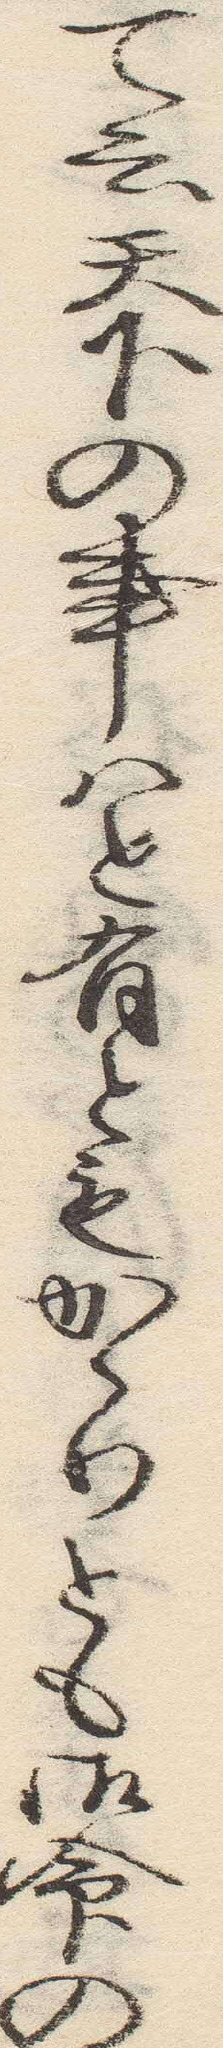て云天下の事はと有ともかゝりとも御命の
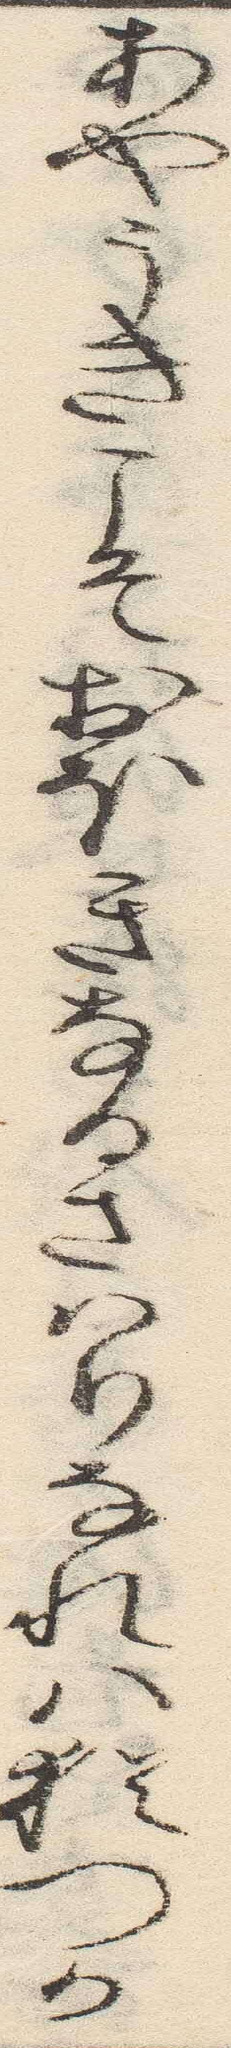あやうきこそおほきなるさはりなれは猶つか
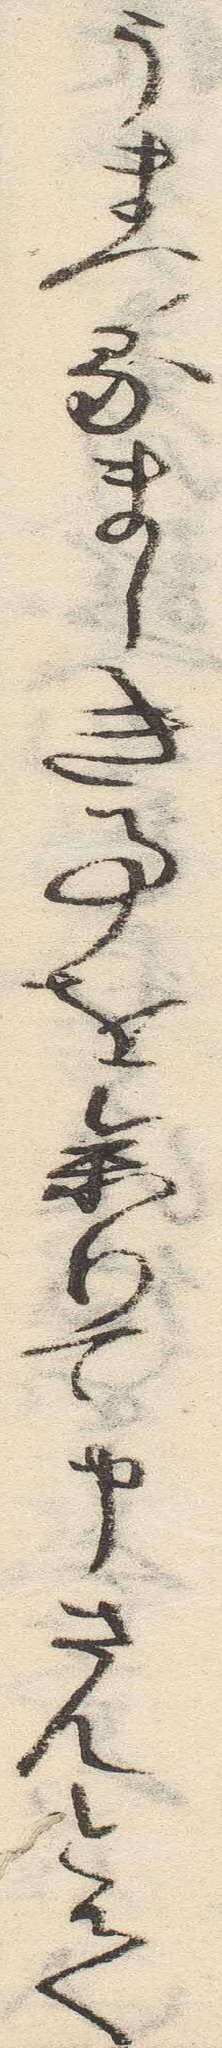うまつるましき事を参りて申さんとて

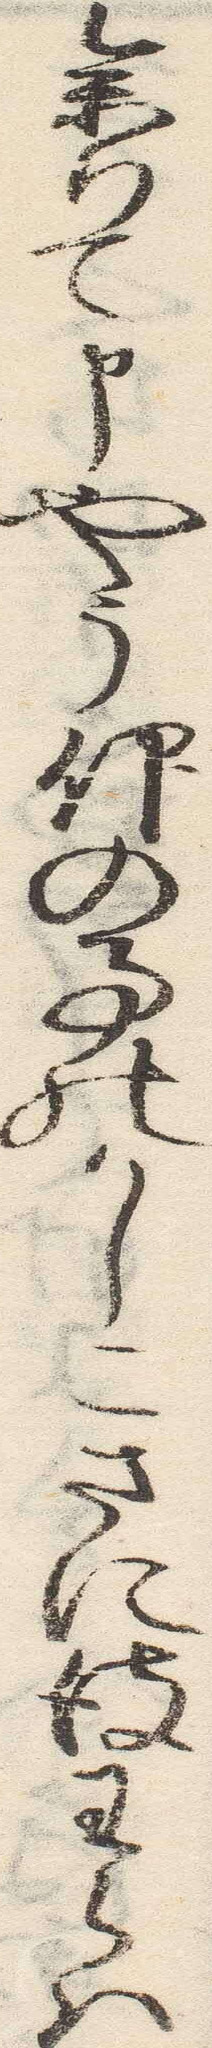参りて申やう仰の事のかしこさにはわらは
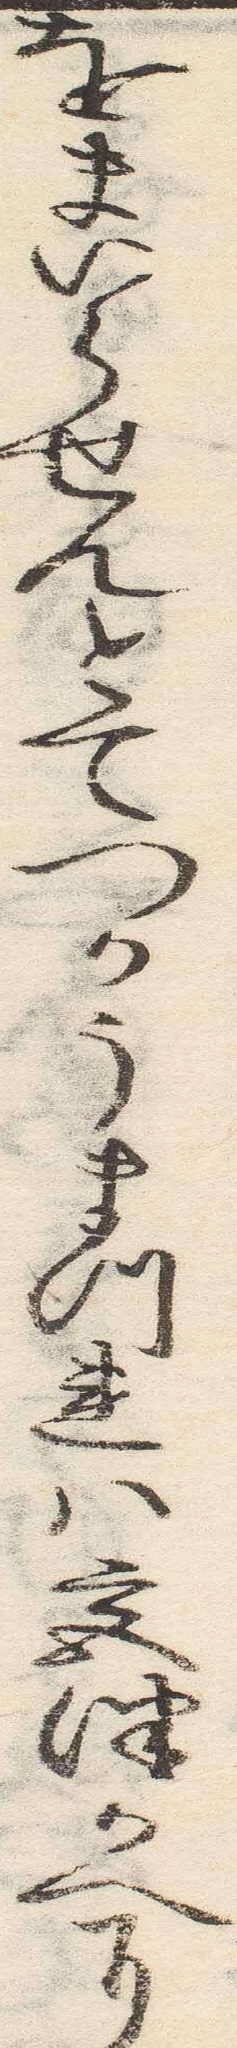をまいらせんとてつかうまつれは宮つかへに
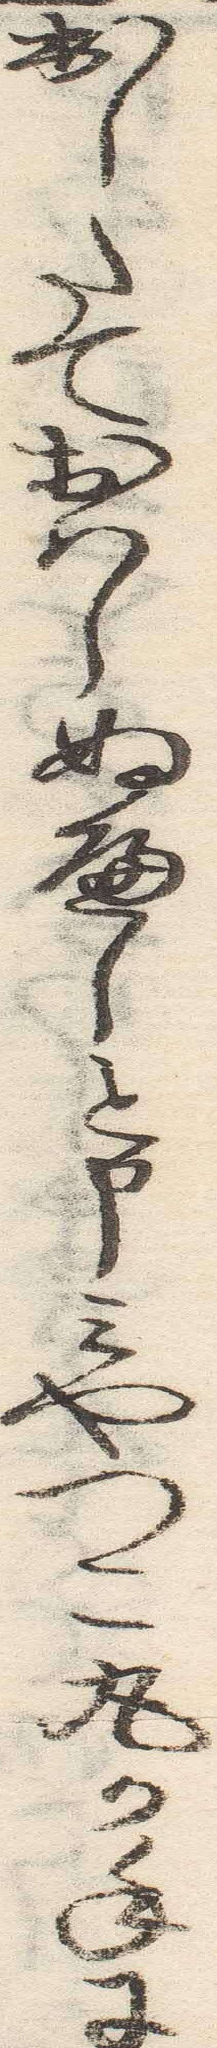出したておはしぬへしと申みやつこ丸か手に
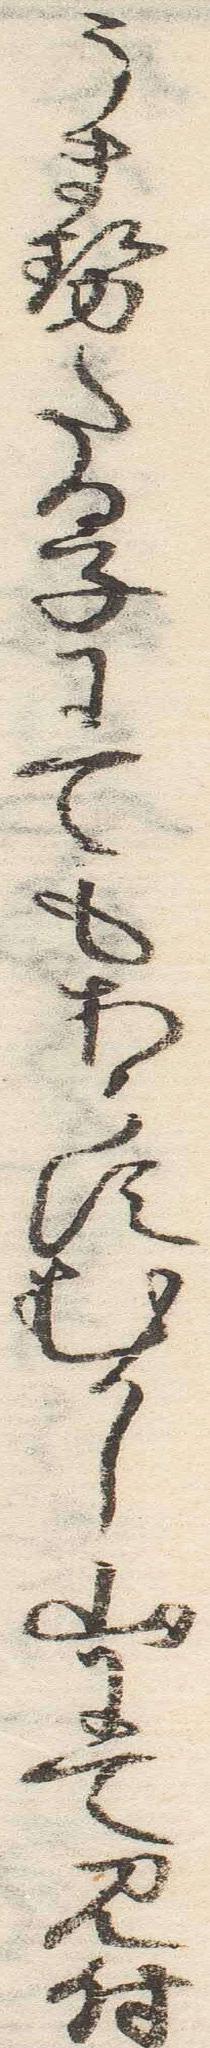うませたる子にてもあらすむかし山にて見付
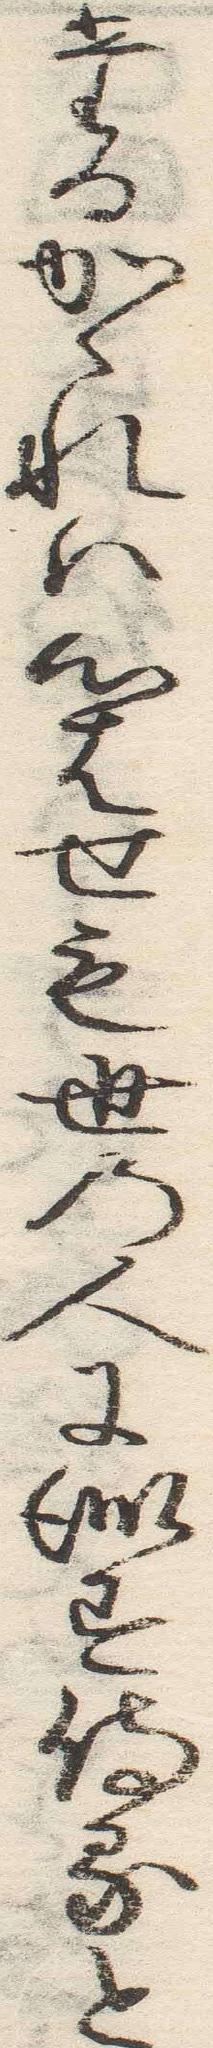たるかゝれは心はせも世の人に似す侍ると
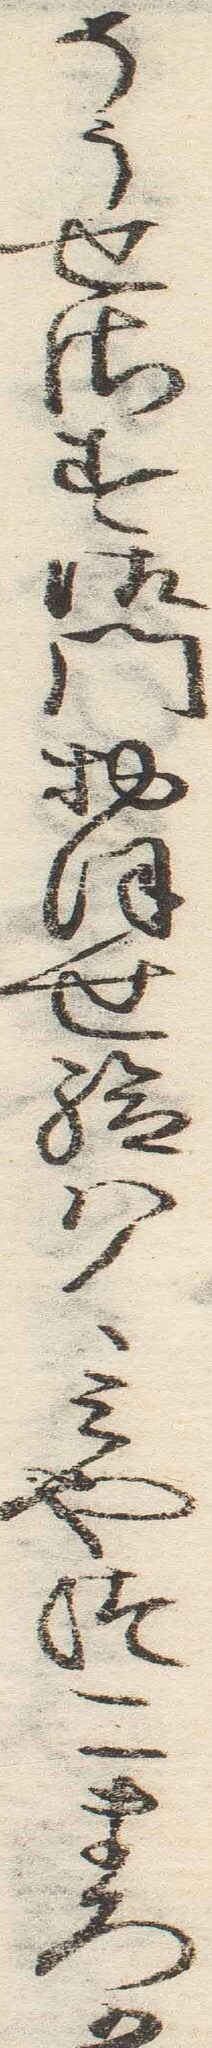そうせさす御門おほせ給はくみやつこまろか
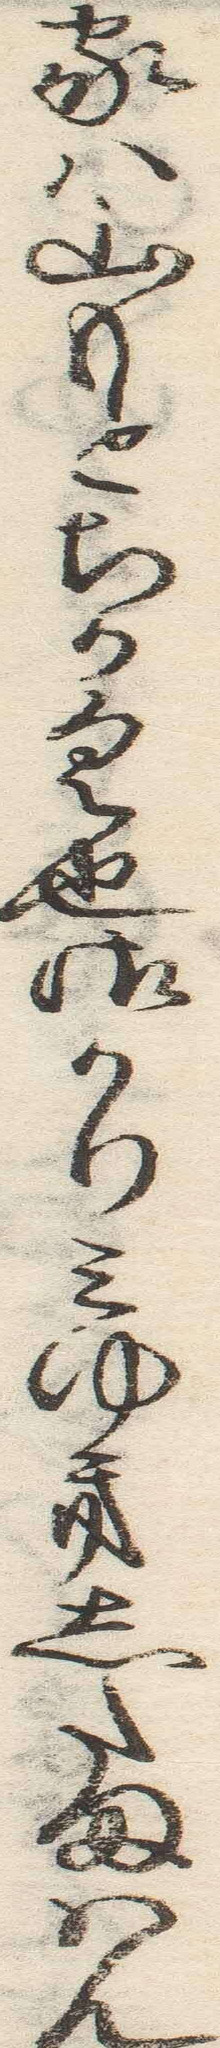家は山もとちかく也御かりみゆきしたまはん
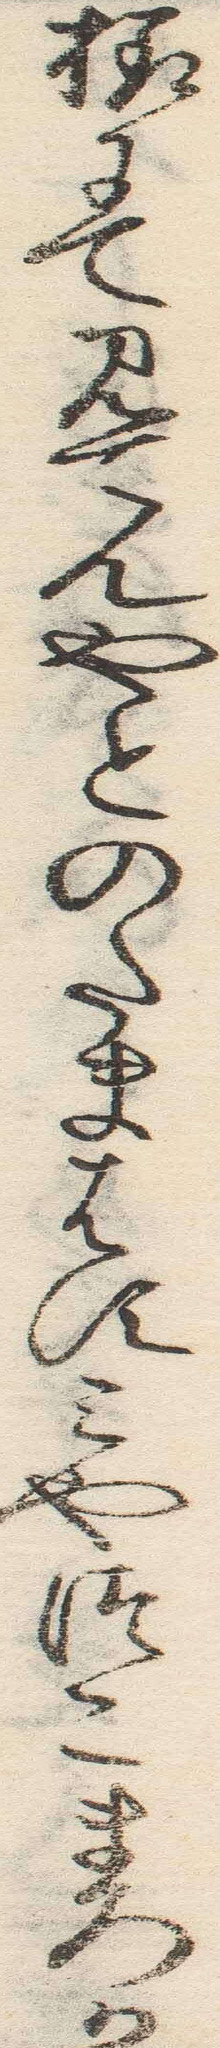様にて見てんやとのたまはすみやつこまろか
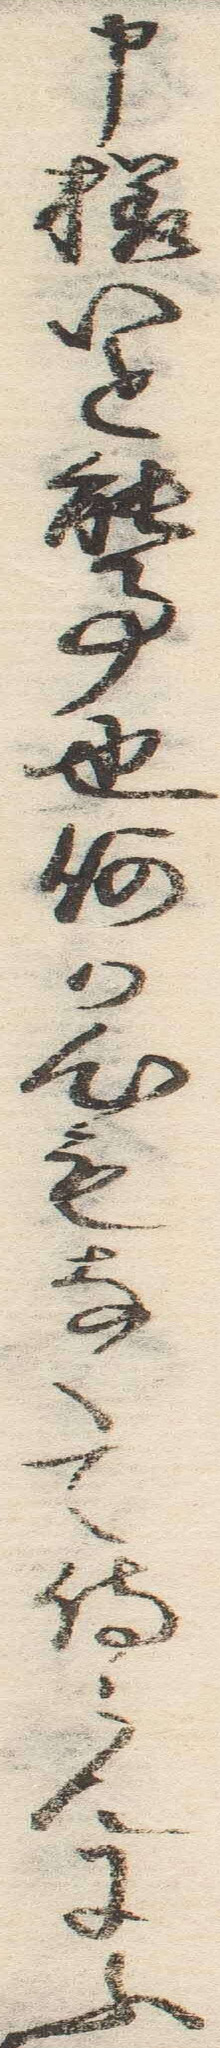申様いと能事也何か心もなくて侍らんにふ
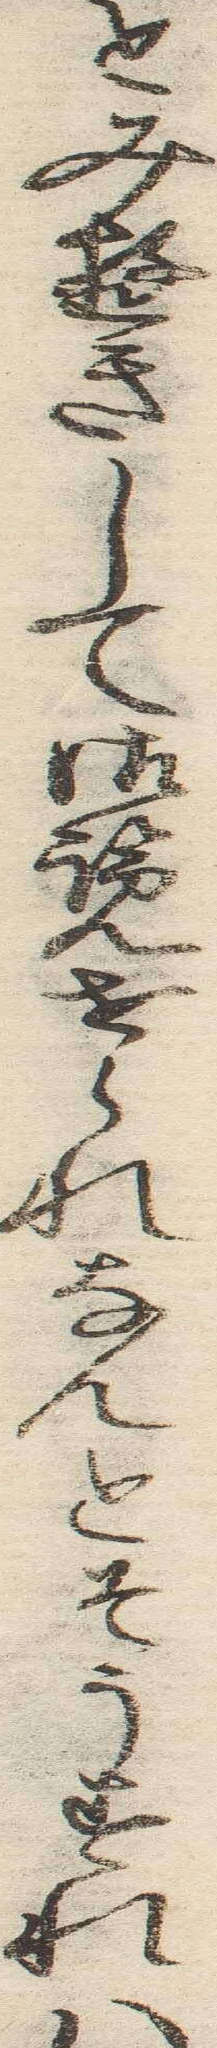とみゆきして御覧せられなんとそうすれは
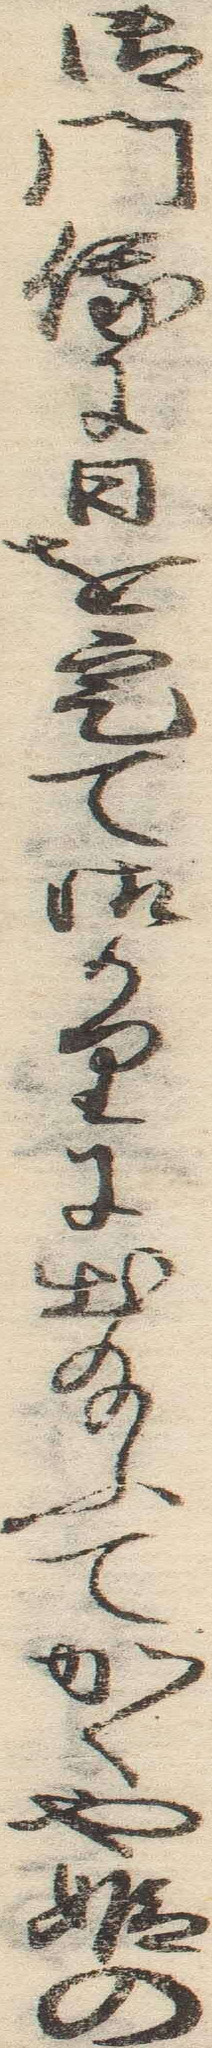御門俄に日を定て御かりに出給ふてかくや姫の

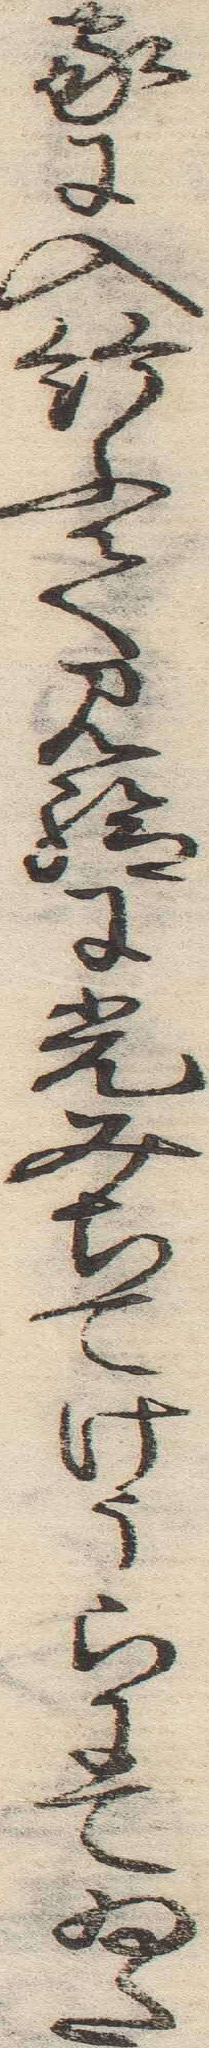家に入給ふて見給に光みちてけうらにてゐた
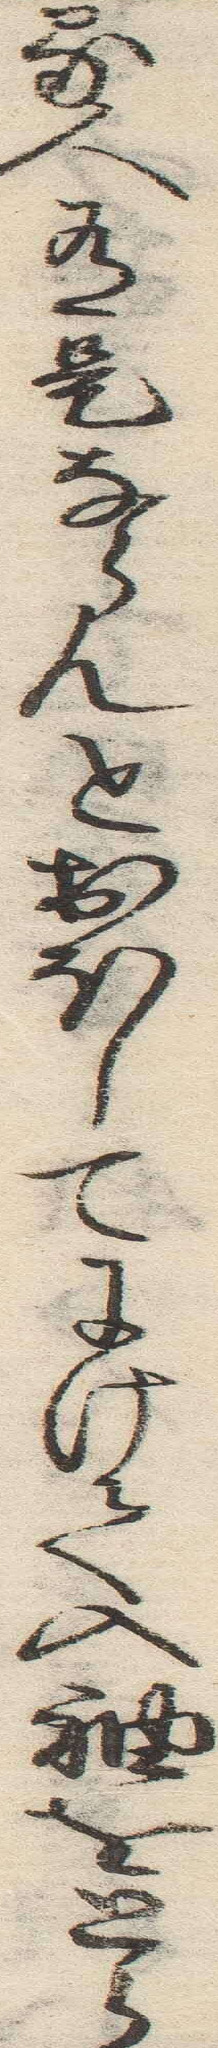る人有是ならんとおほしてにけて入袖をとら
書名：竹取物語
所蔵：東京学芸大学附属図書館 国文学研究資料館
